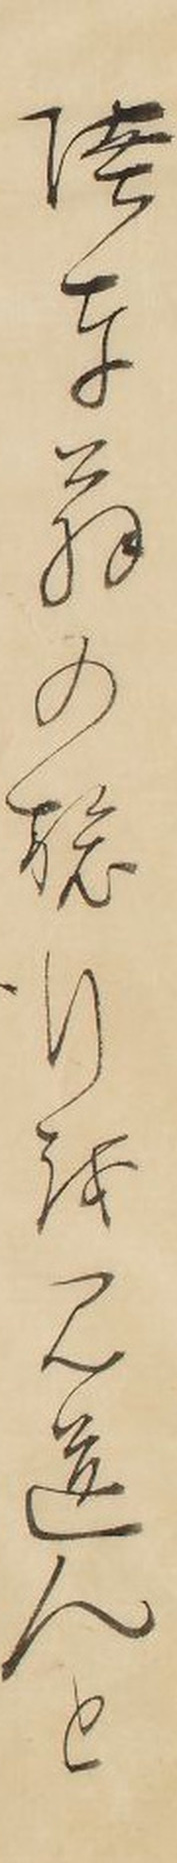陸車翁の旅行を見送らんと
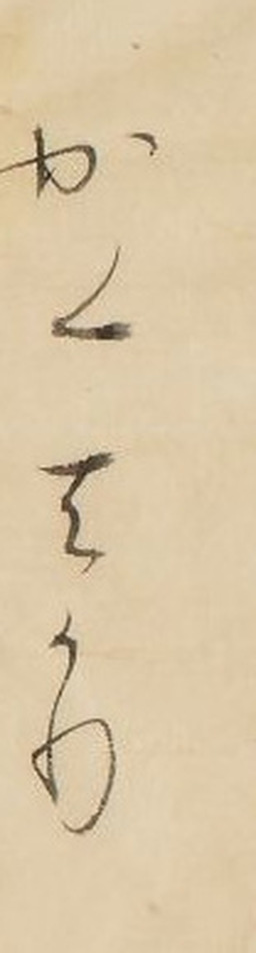かくはかり
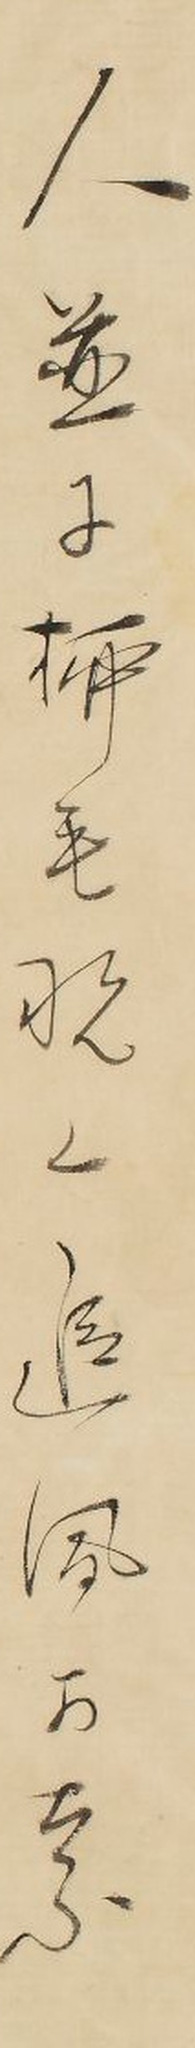人並に柳も覗く追風かな
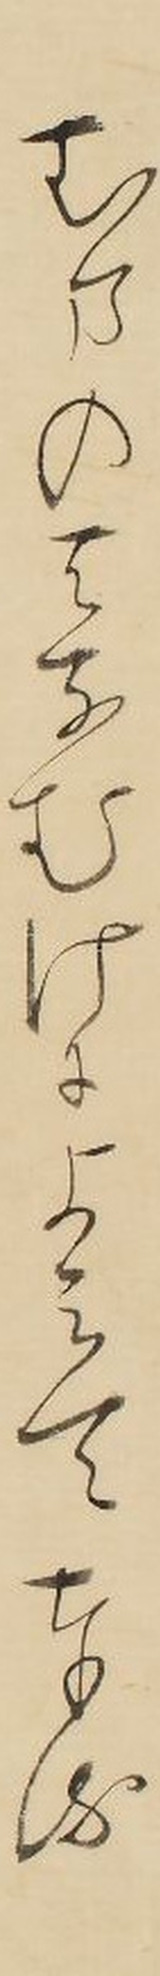むまのはなむけによみて奉る
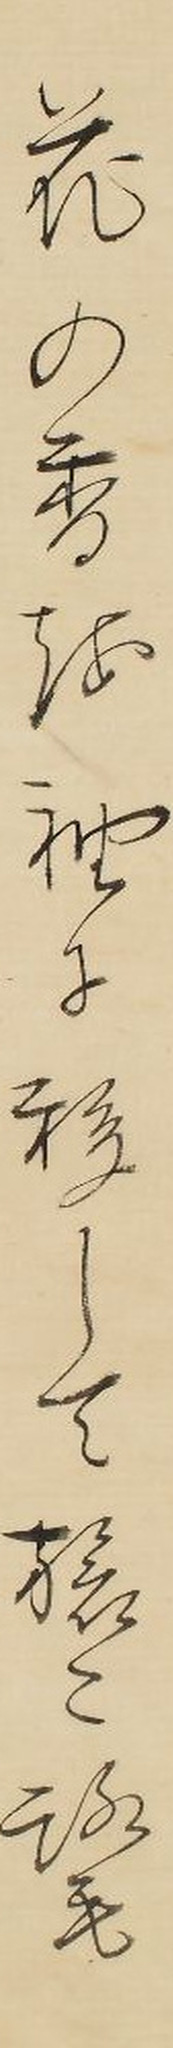花の香を袖に移して旅ころも
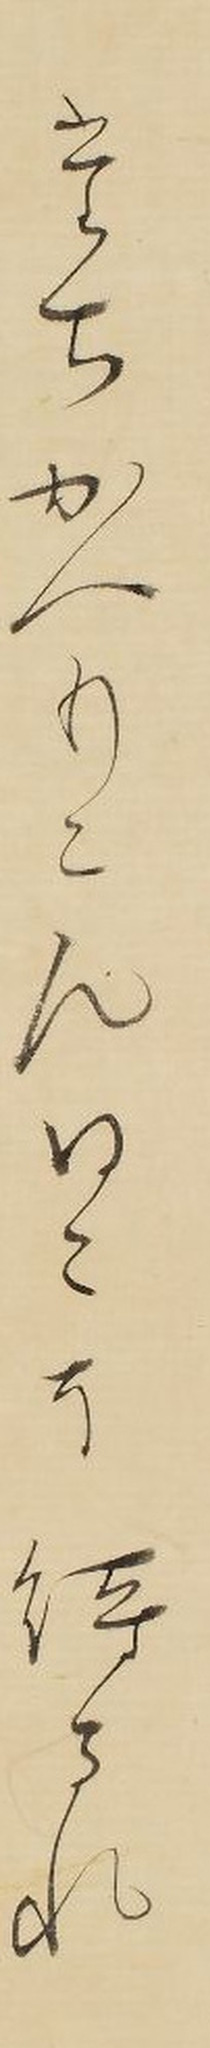たちかへりこん日こそ待るれ
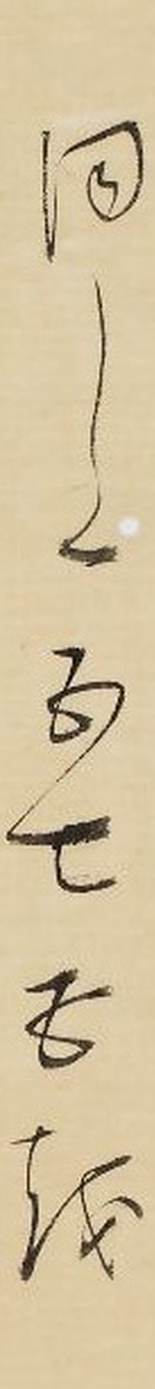同しく五七五を
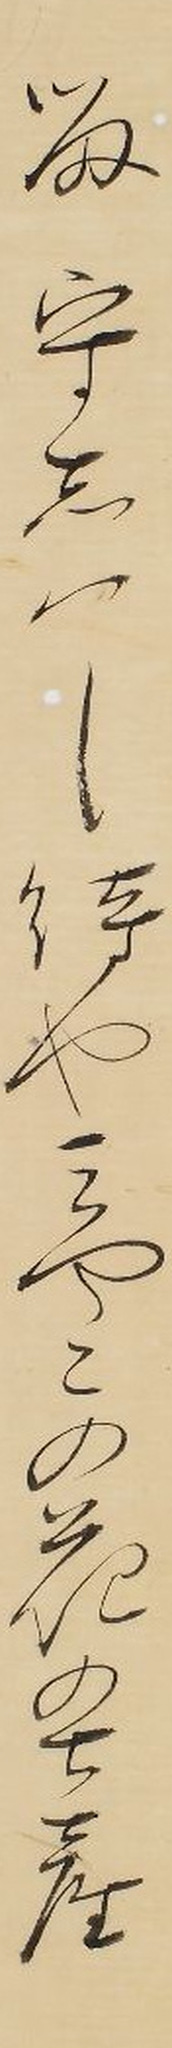留守しはし待やみやこのはなの旅
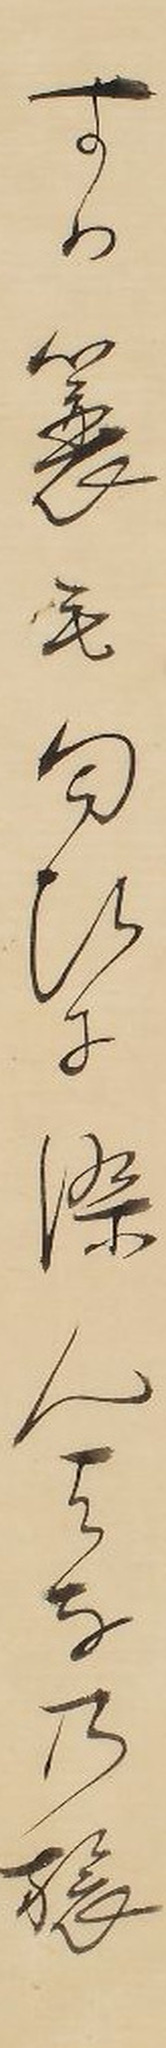すか蓑も匂ひに染んはなの旅
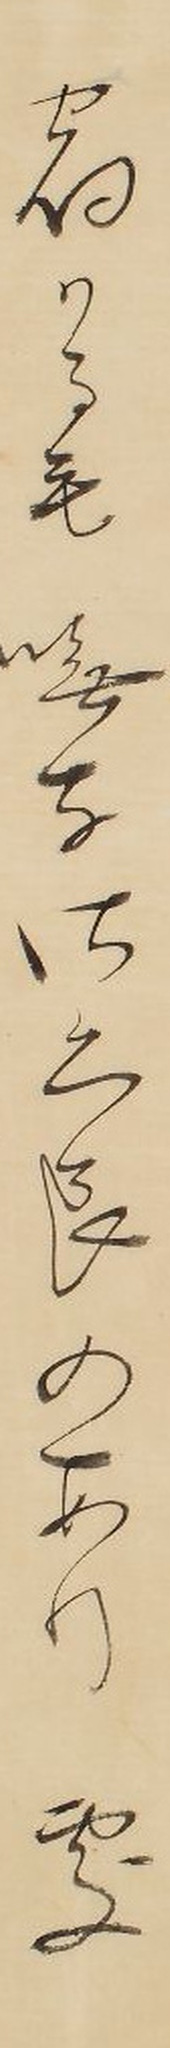宿かるも嘸なさくらのあり処
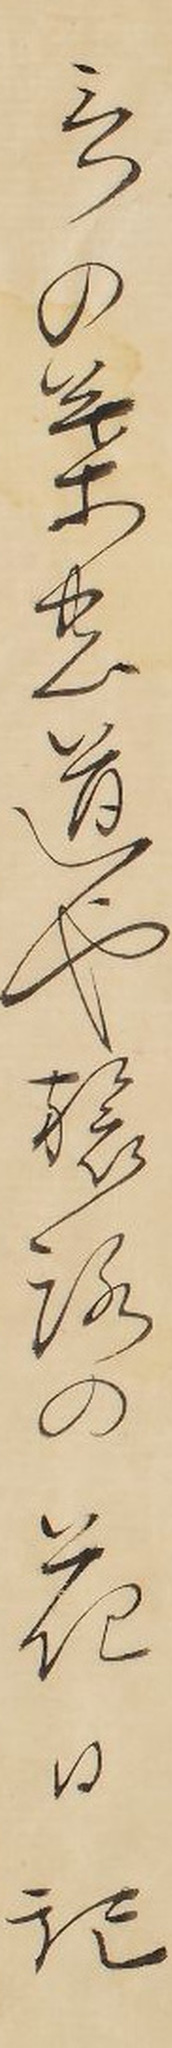言の葉の道や旅路の花日記
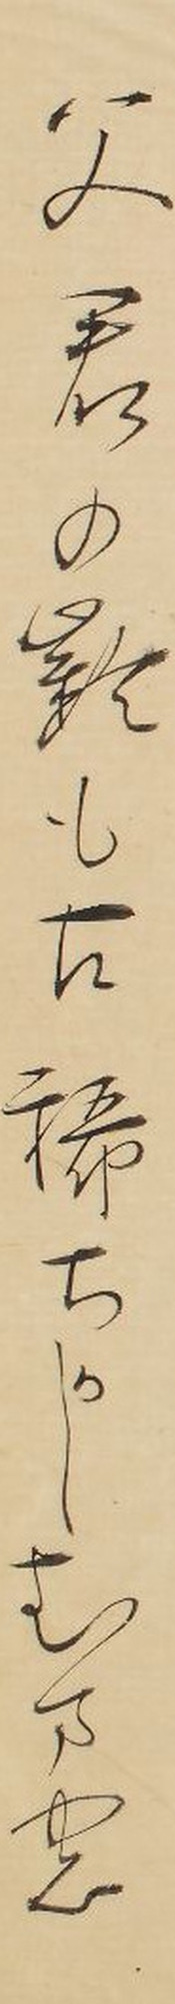父君の齢も古稀ちかしむまの

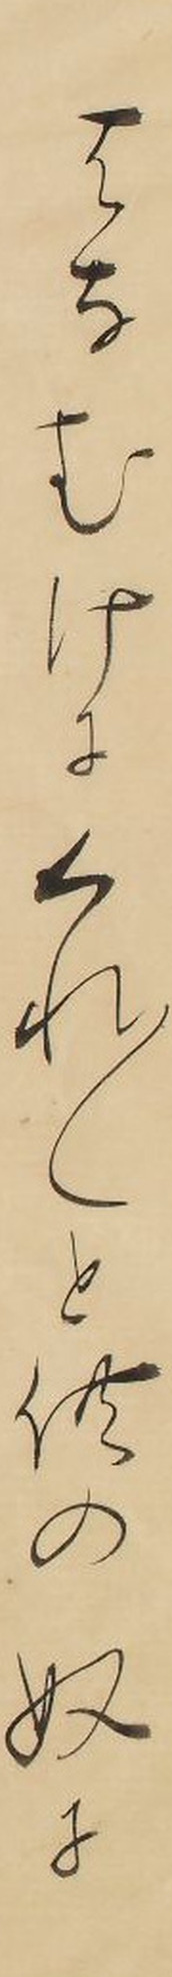はなむけにくれ〳〵と供の奴に
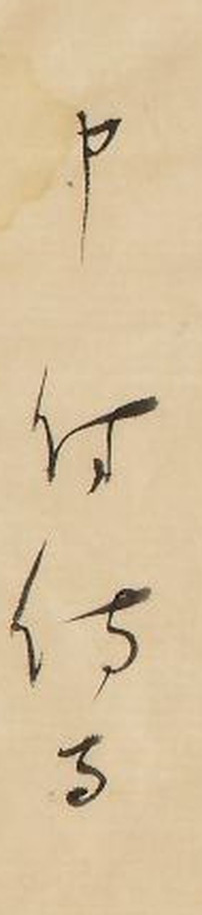申付侍る
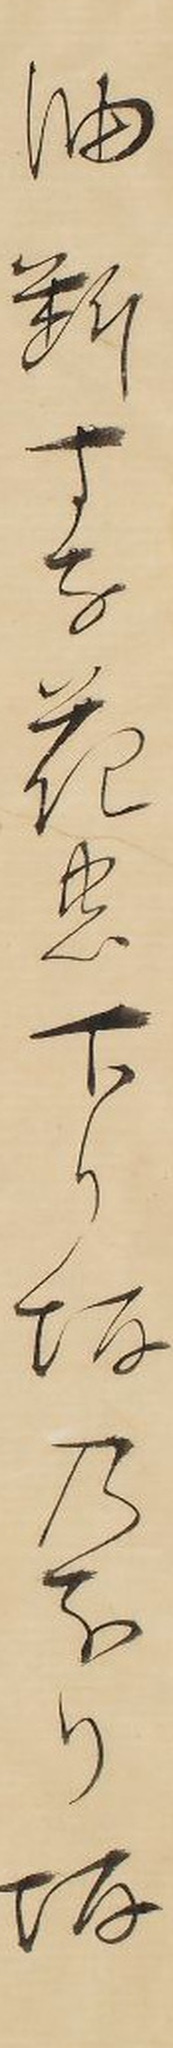油断すな花の下り坂のほり坂
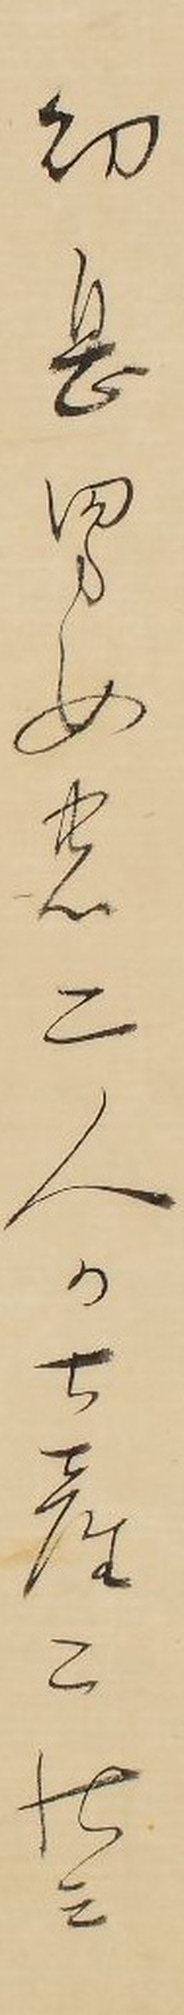幼息男女の二人か土産このみ
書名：花土産
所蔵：徳島県立図書館
